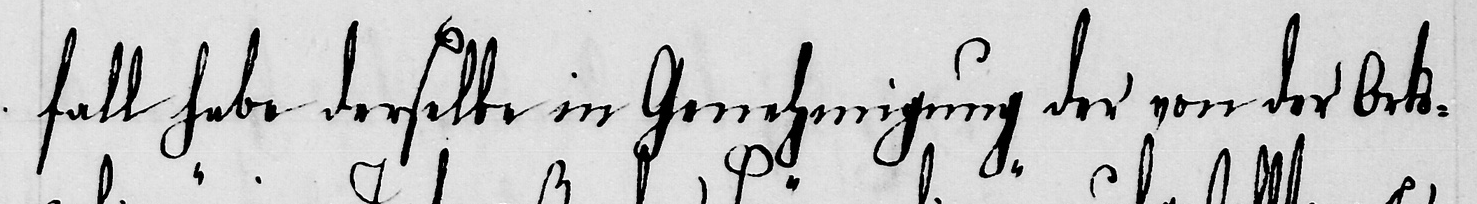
fall habe derselbe in Genehmigung der von der Orts¬
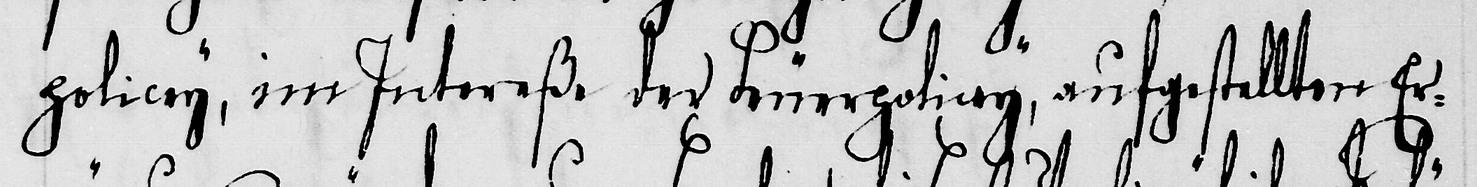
policey, im Intereße der Feuerpolicey, aufgestellten Er¬
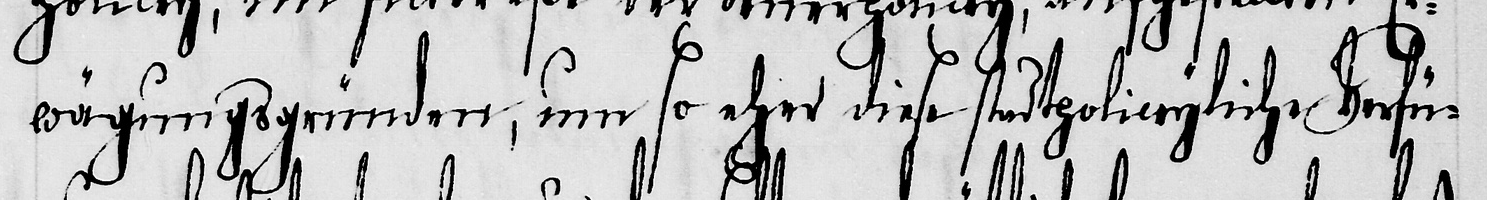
wägungsgründen, um so eher diese stadtpoliceyliche Verfü¬
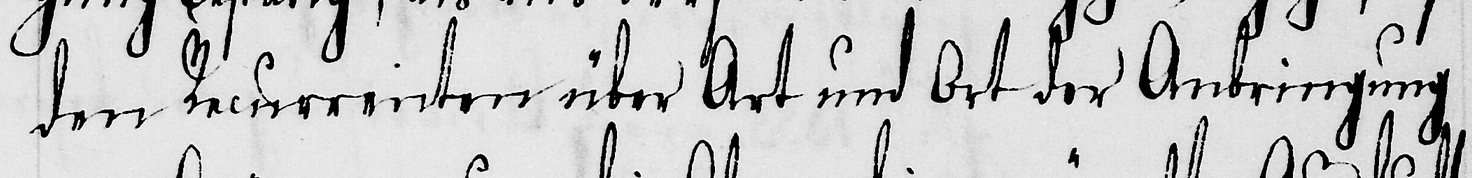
den Recurrenten über Art und Ort der Anbringung
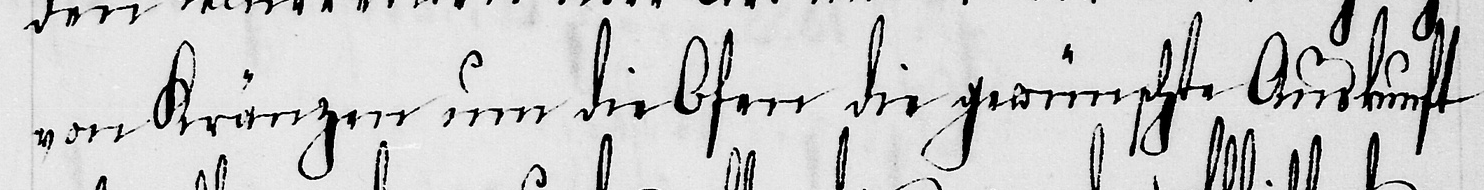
von Kränzen um die Ofen die gewünschte Auskunft
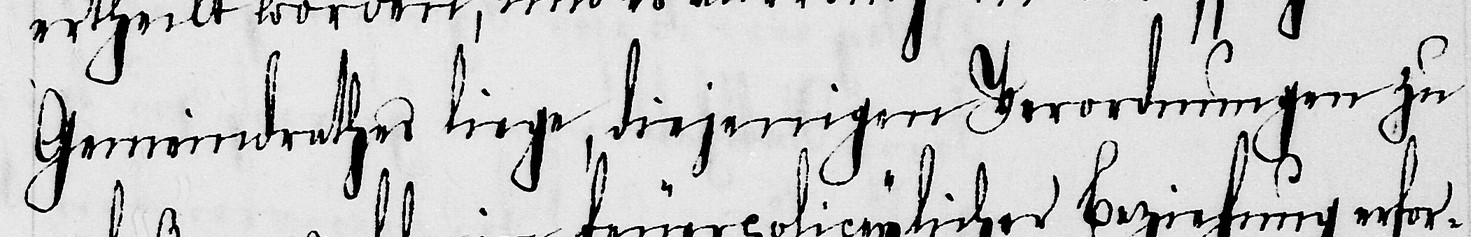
Gemeindrathes liege, diejenigen Verordnungen zu
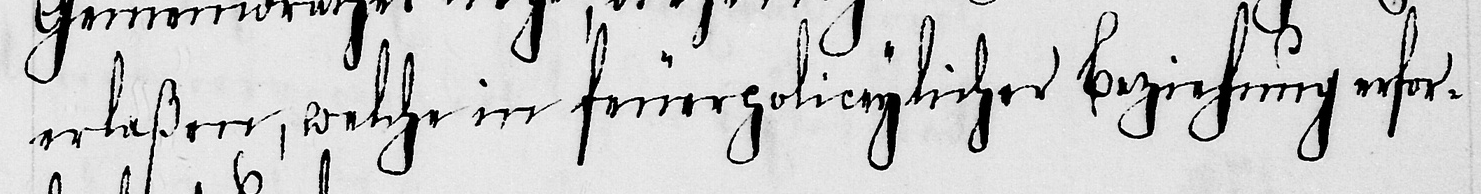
erlaßen, welche in feuerpoliceylicher Beziehung erford¬
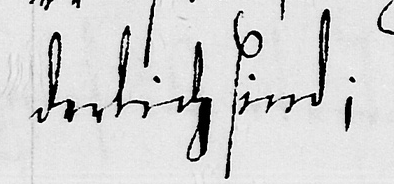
erlich sind;
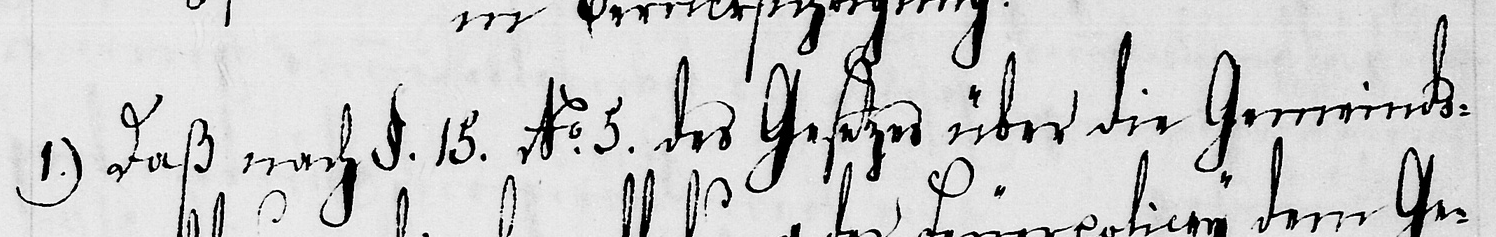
1.) Daß nach §. 15. N°. 5. des Gesetzes über die Gemeinds¬
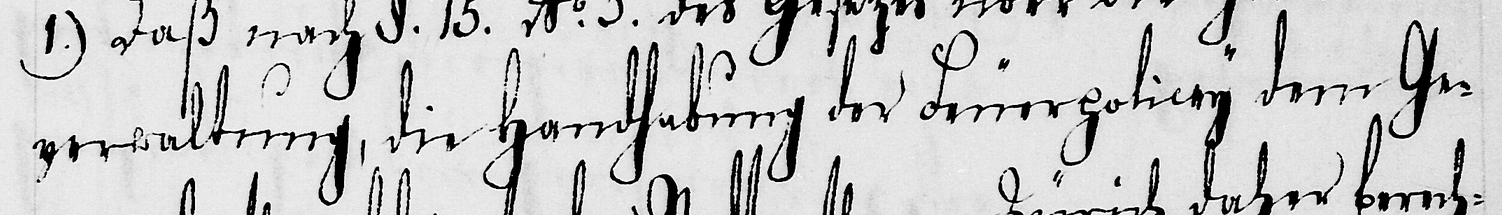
verwaltung, die Handhabung der Feuerpolicey dem Ge¬
